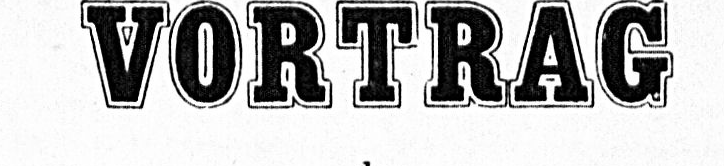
VORTRAG
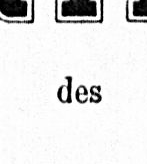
des
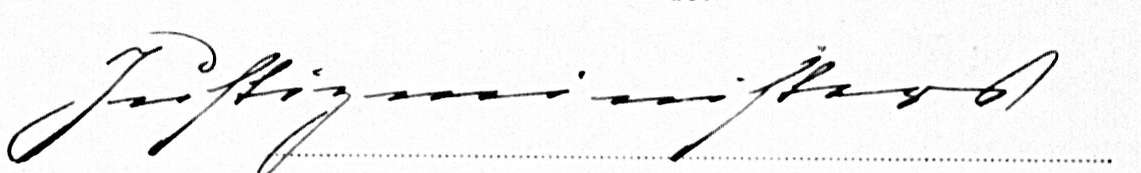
Justizmeisters
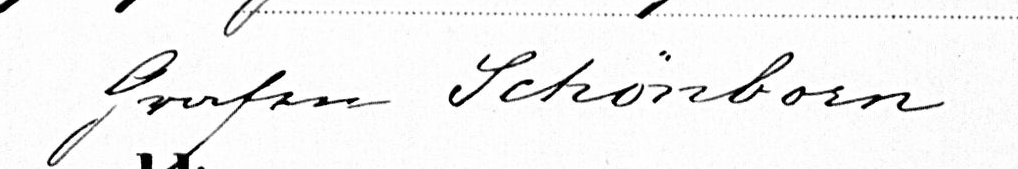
Grafen Schönborn
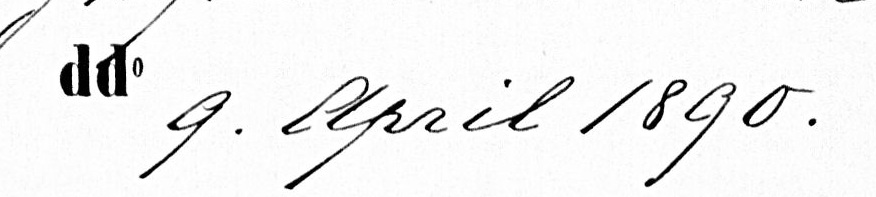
dd° 9. April 1890.
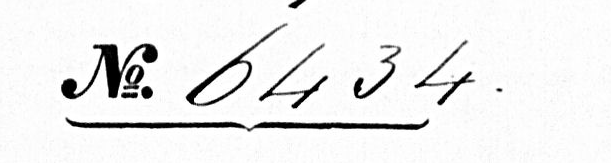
Nr. 6434.
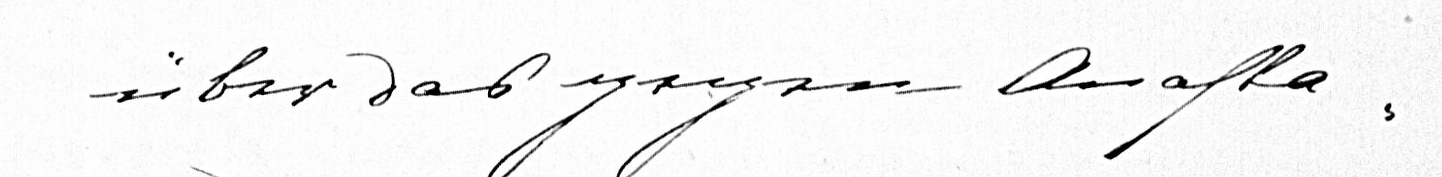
über das gegen Anasta¬
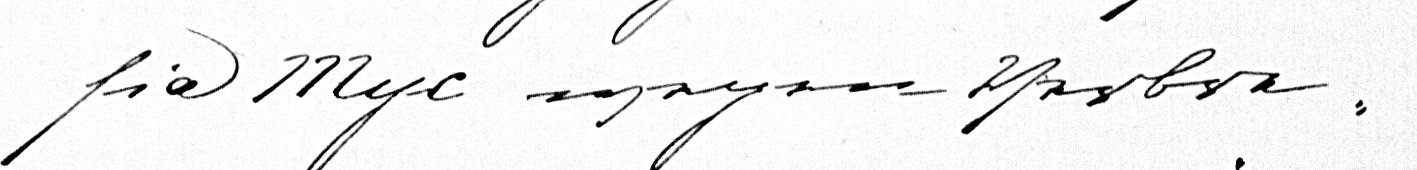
sia Myc wegen Verbre¬
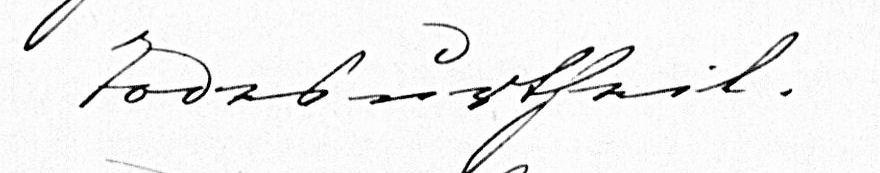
Todesurtheil.
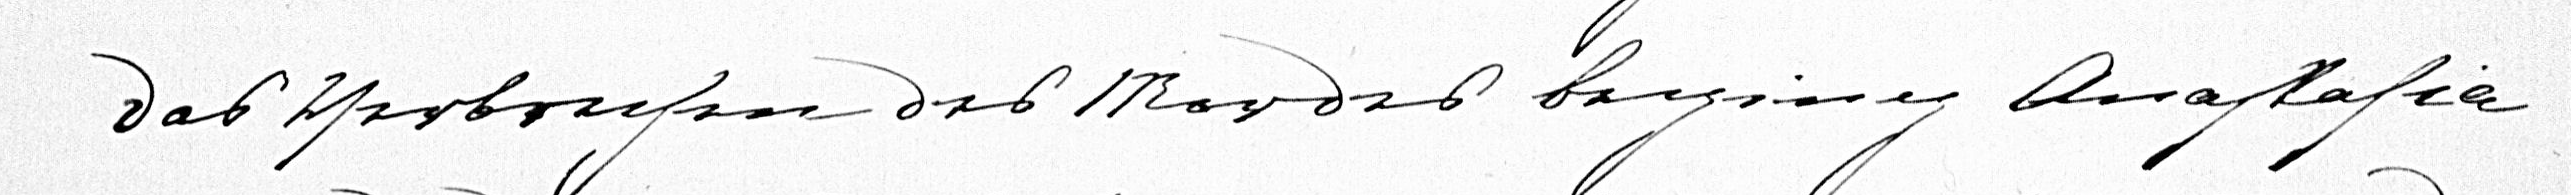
Das Verbrechen des Mordes beging Anastasia
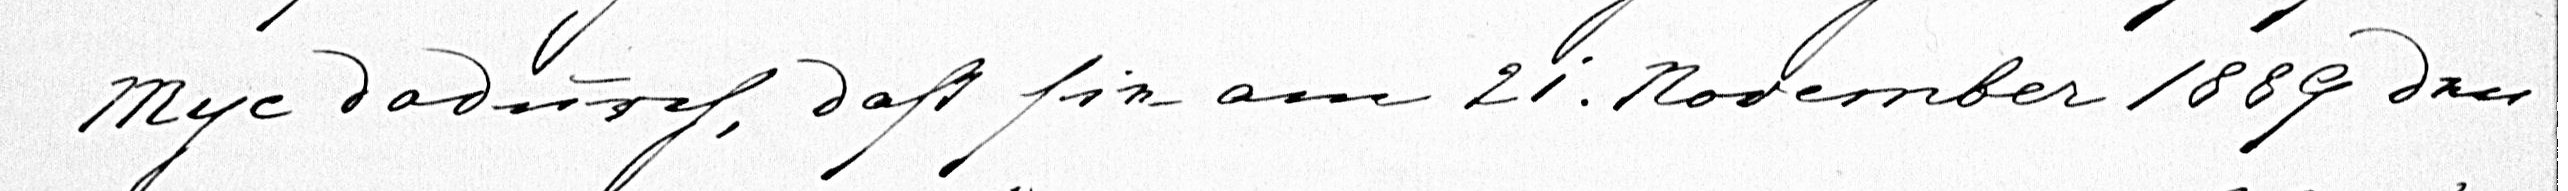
Myc dadurch, daß sie am 21. November 1889 den
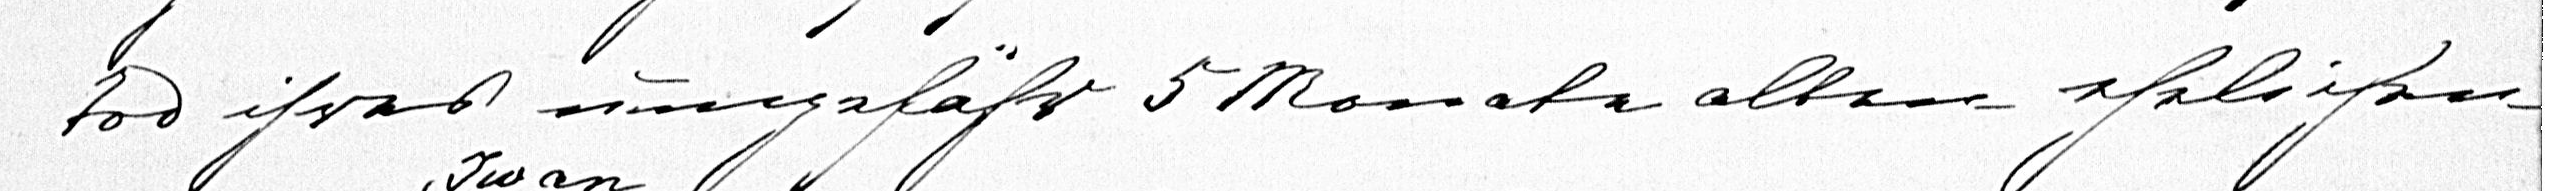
Tod ihres ungefähr 5 Monate alten ehelichen
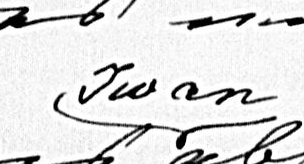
Iwan
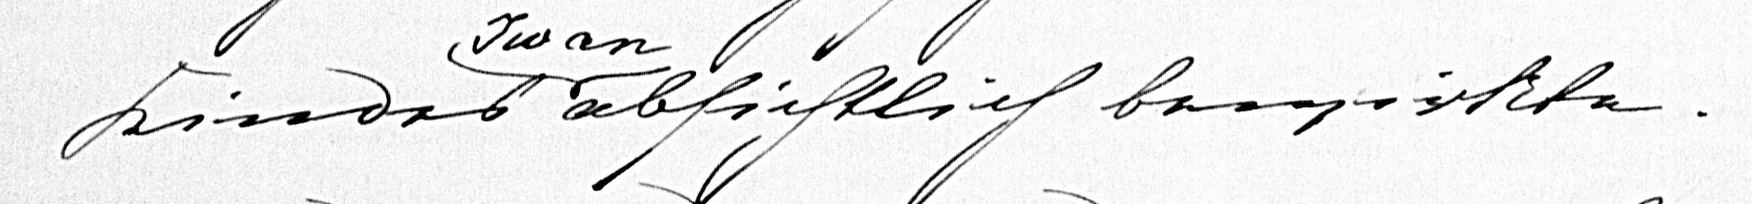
Kindes absichtlich bewirkte.
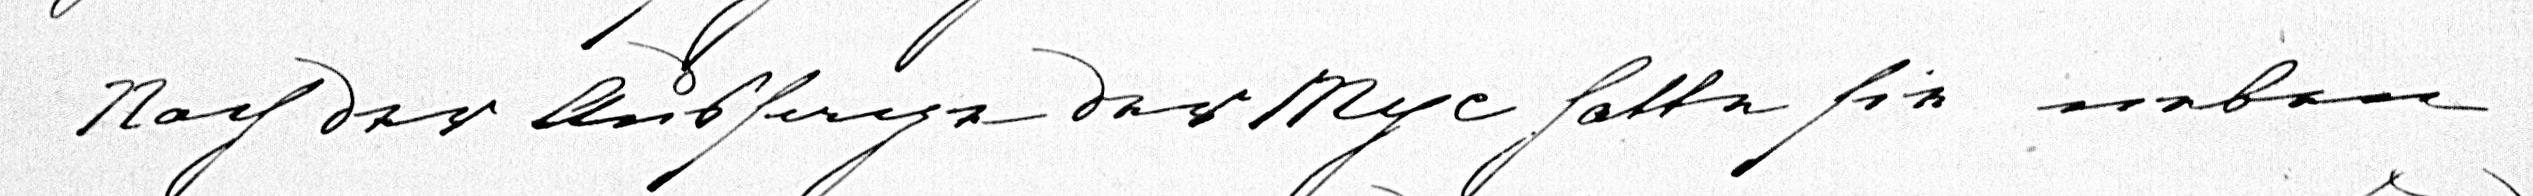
Nach der Aussage der Myc hatte sie neben
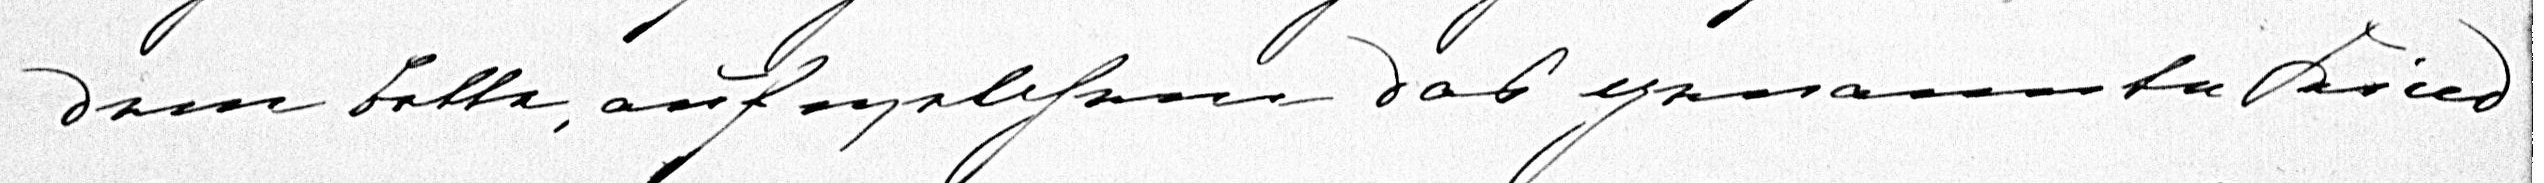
dem Bette, auf welchem das genannte Kind
